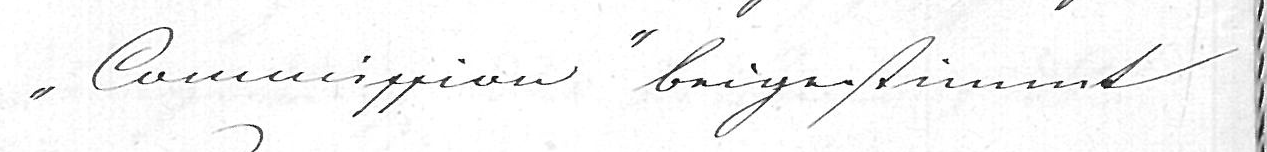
"Commission" beigestimmmt
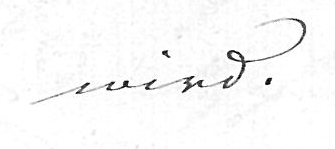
wird.
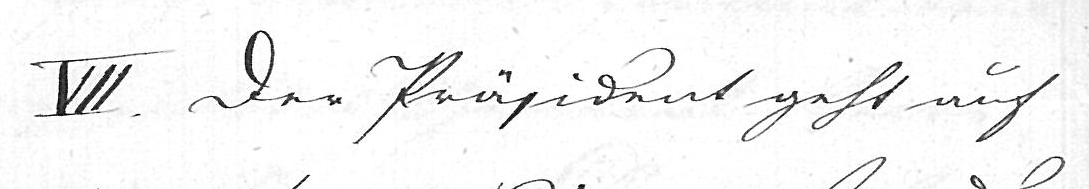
VII. Der Präsident geht auf
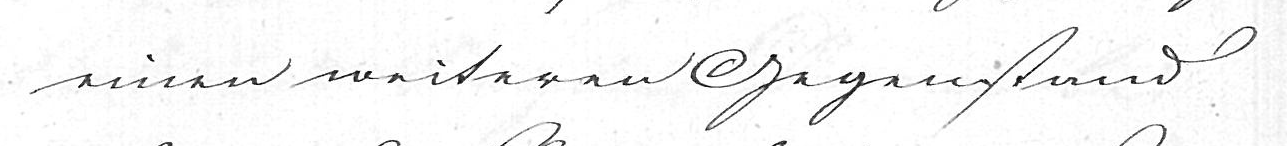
einen weiteren Gegenstand
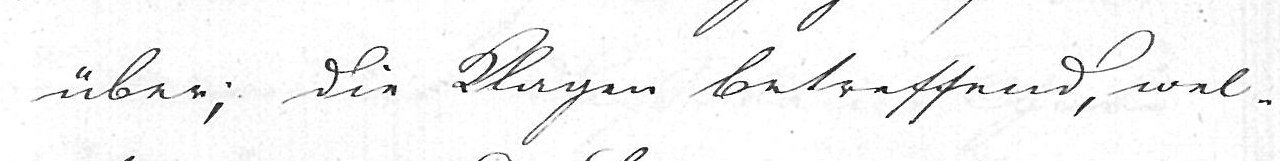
über; die Klagen betreffend, wel-
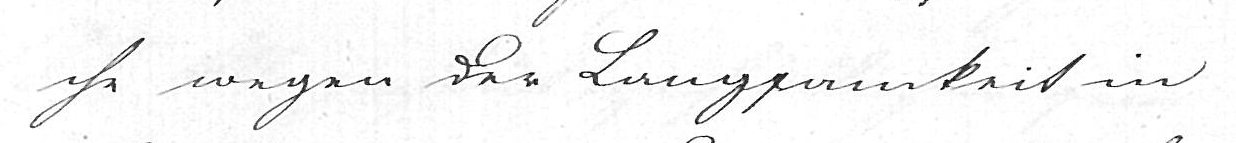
che wegen der Langsamkeit in
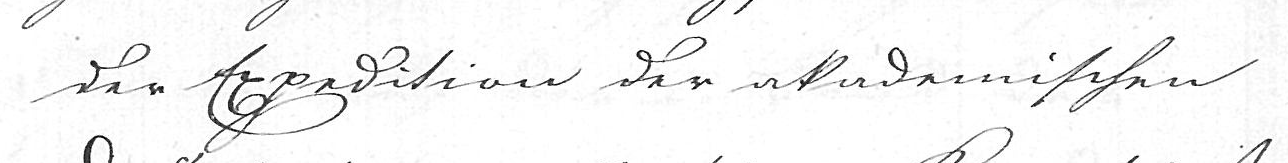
der Expeition der akademischen
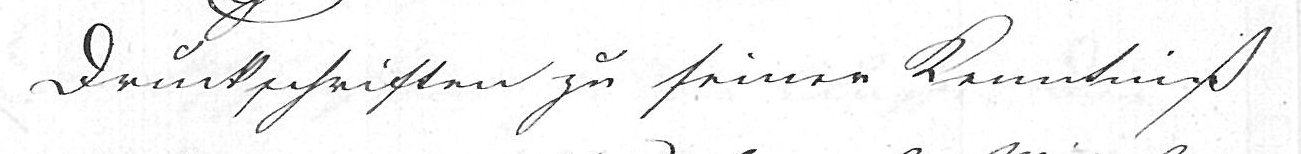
Druckschriften zu seiner Kenntniß
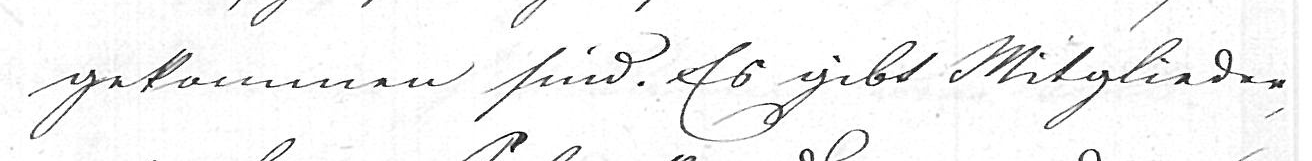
gekommen sind. Es gibt Mitglieder,
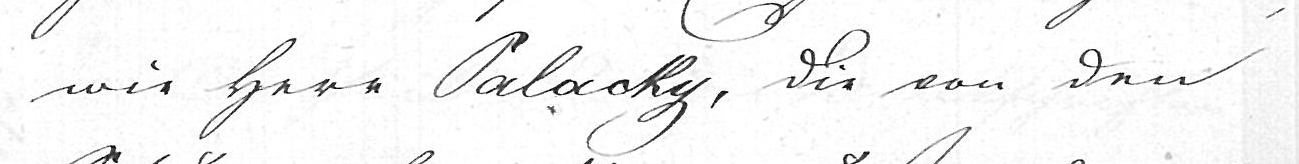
wir Herr Palacky, die von den
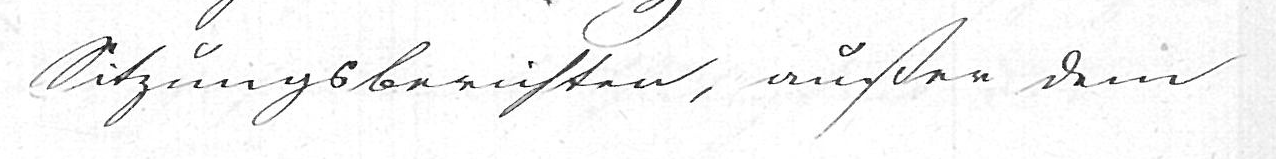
Sitzungsberichten, außer dem
